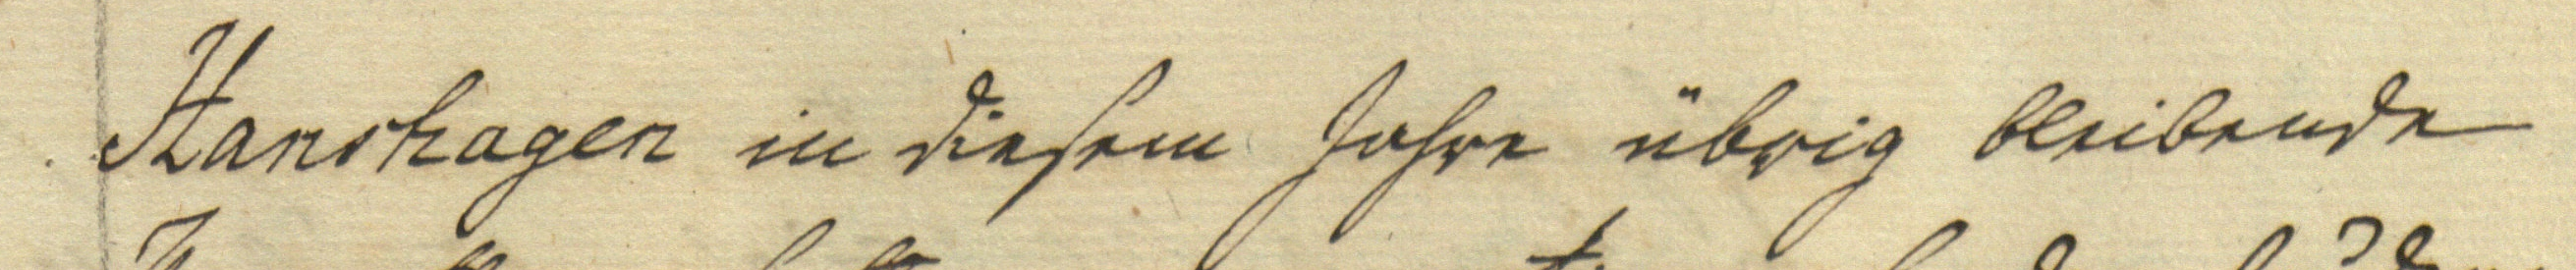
Hanshagen in diesem Jahre übrig bleibende
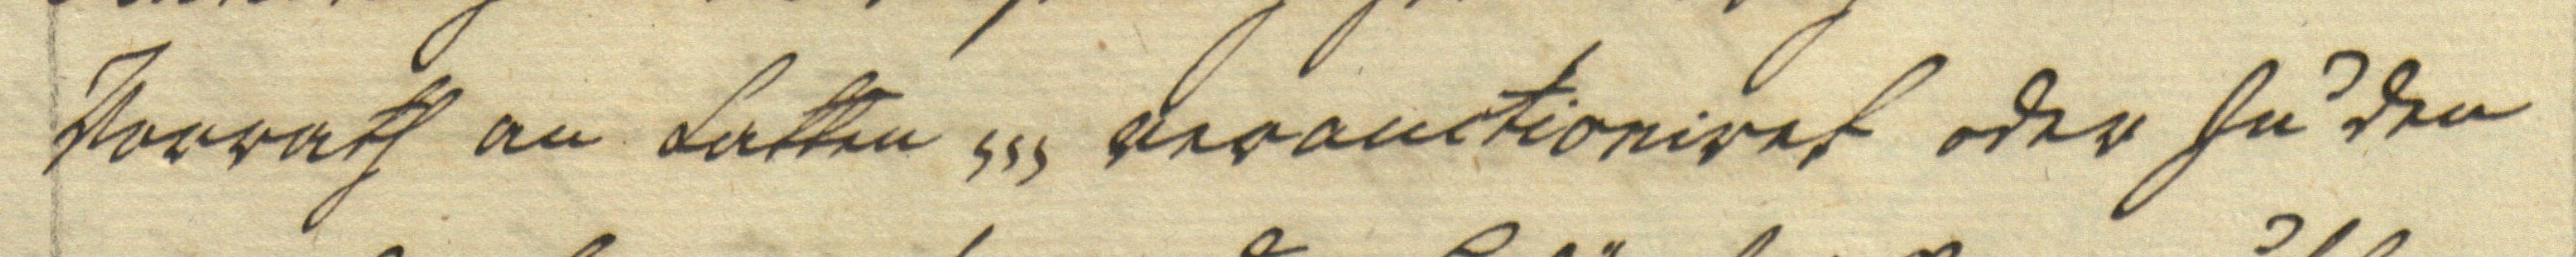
Vorrath an Latten. verauctioniret oder zu den
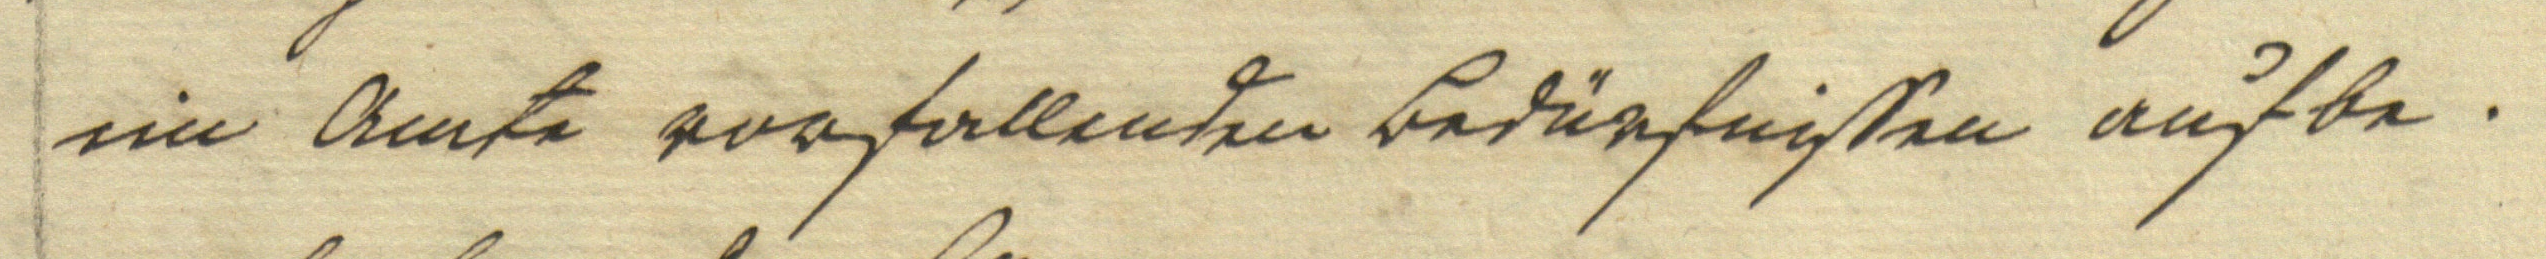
im Amte vorfallenden Bedürfnissen aufbe¬
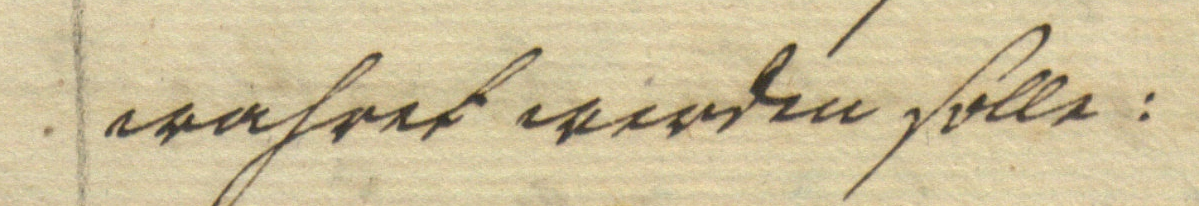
wahret werden solle:
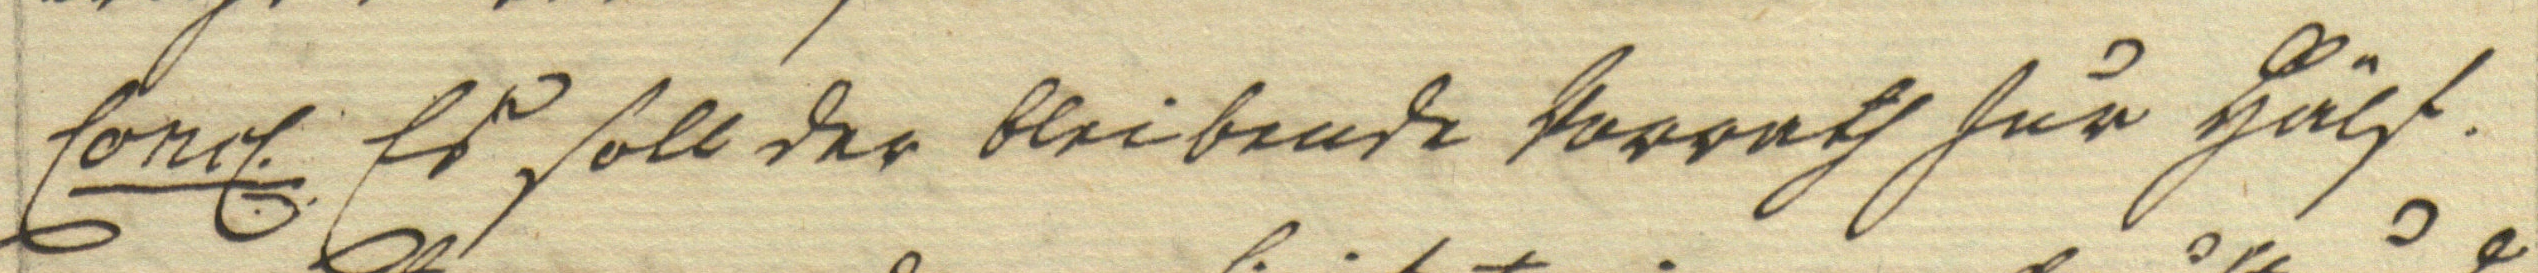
Concl. Es soll der bleibende Vorrath zur Hälf¬
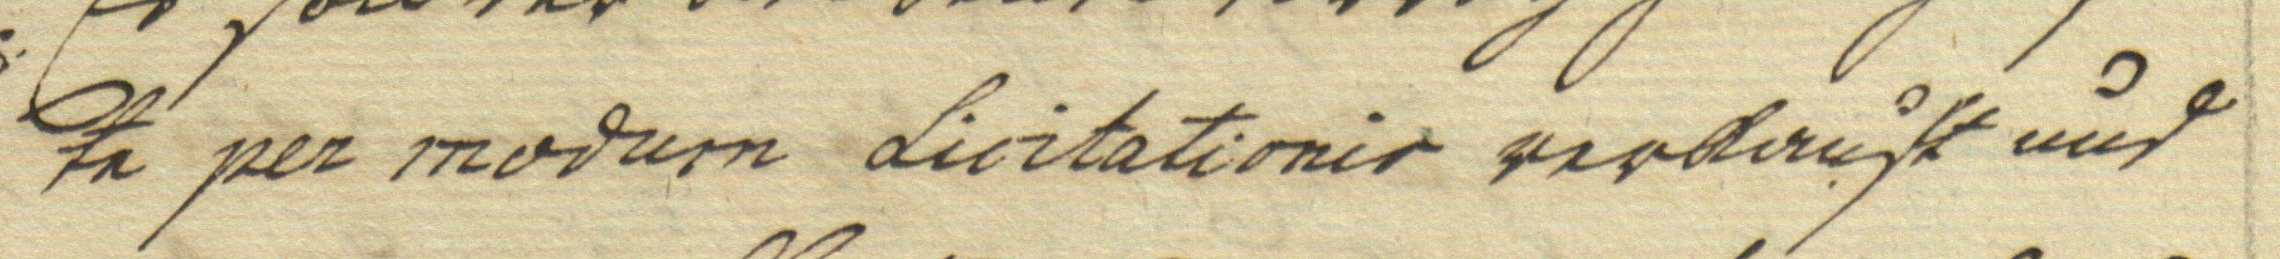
te per modum Licitationis verkauft und
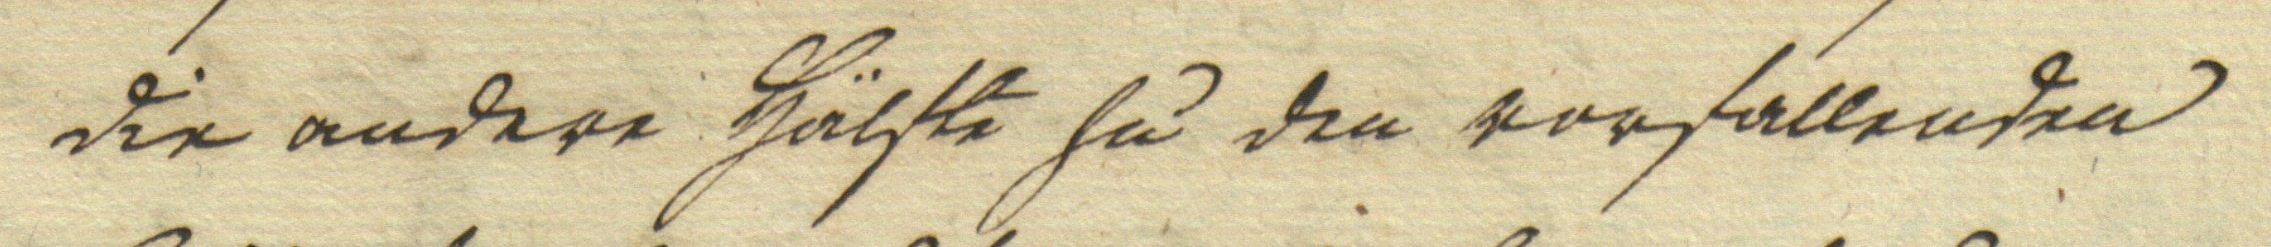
die andere Hälfte zu den vorfallenden
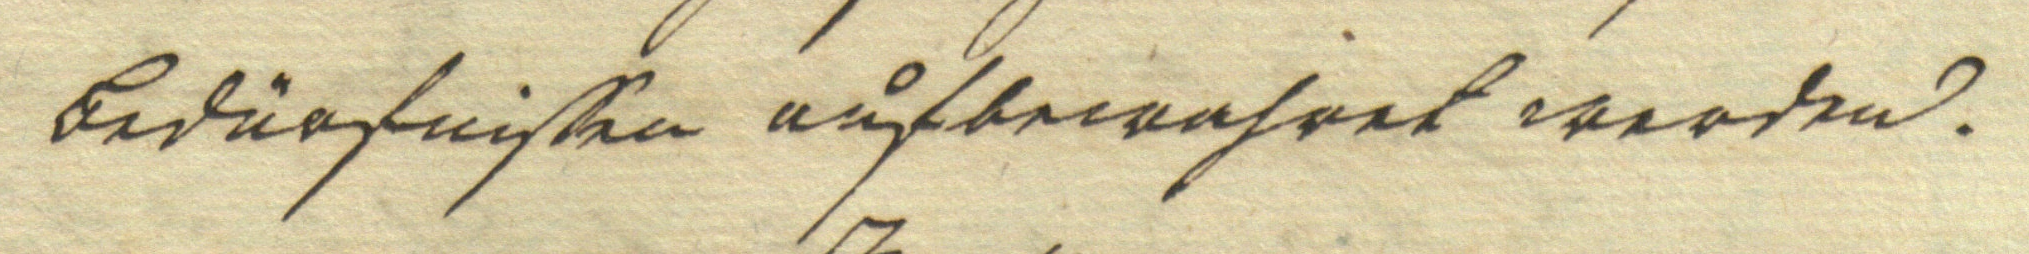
Bedürfnissen aufbewahret werden.
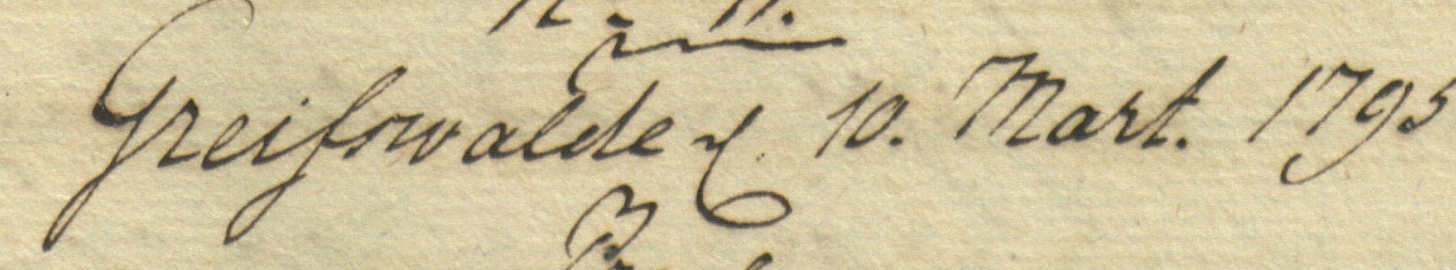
Greifswalde 10. Mart. 1795.
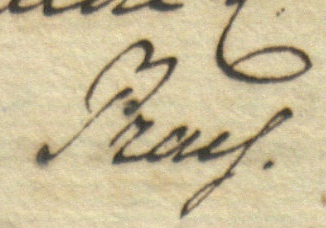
Praes.
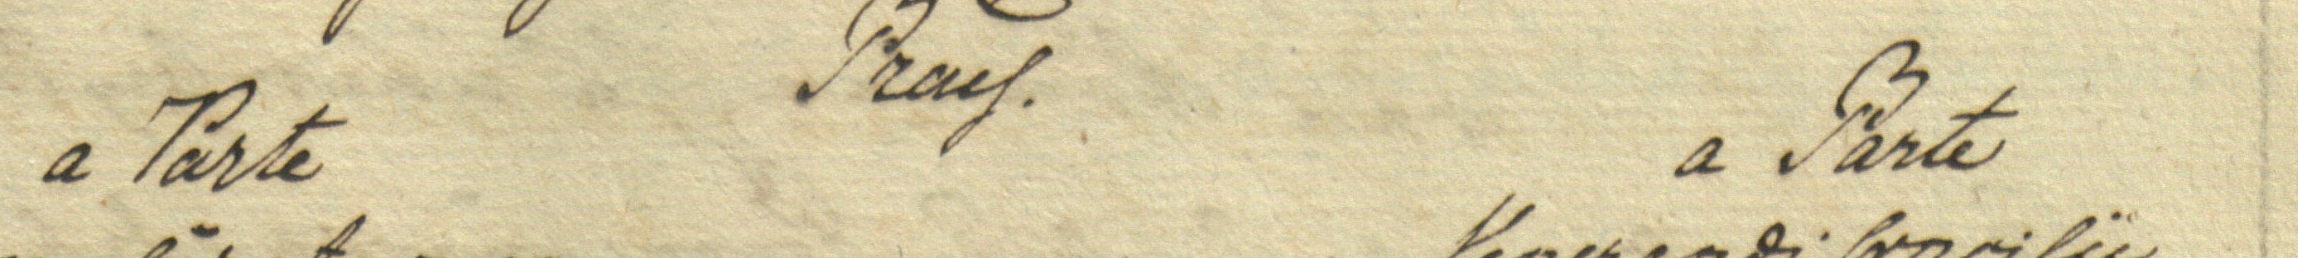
a Parte a Parte
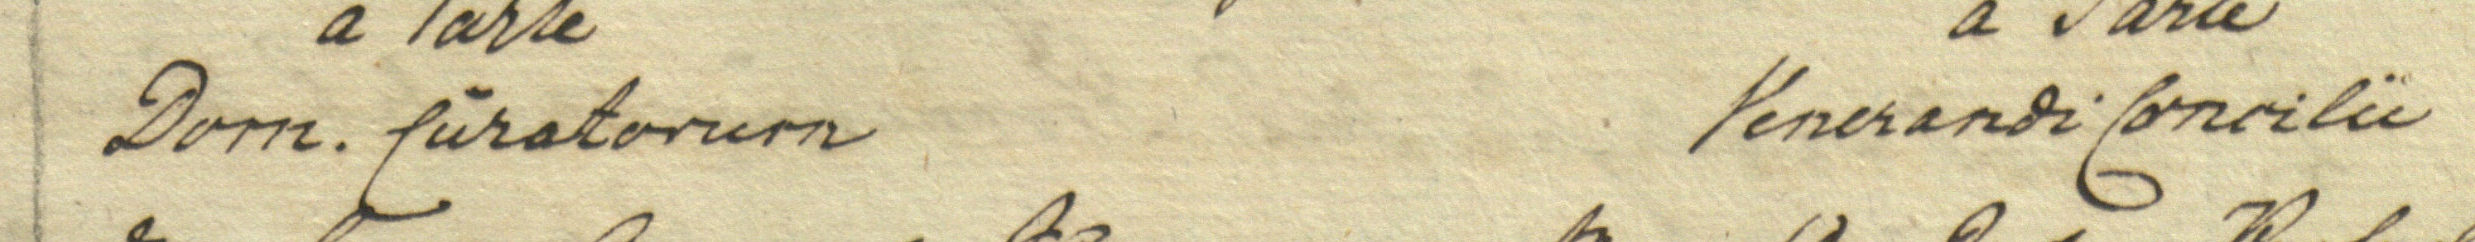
Dom. Curatorum Venerandi Concilii
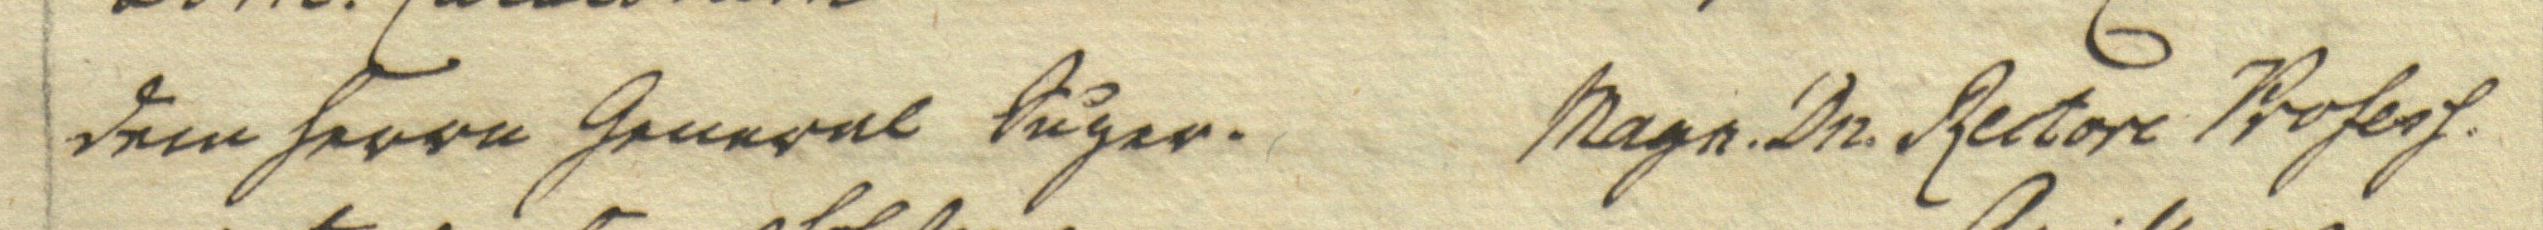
dem Herrn General Super¬ Magn. Dn. Rectore Profess.
